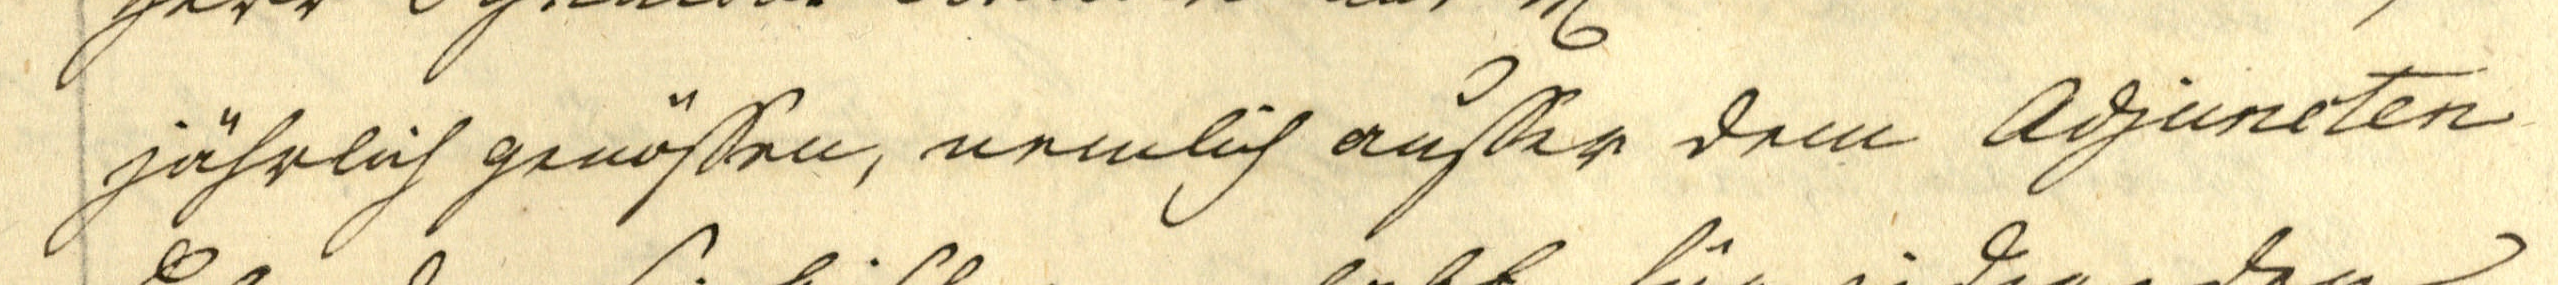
jährlich genössen, nemlich ausser dem Adjuncten
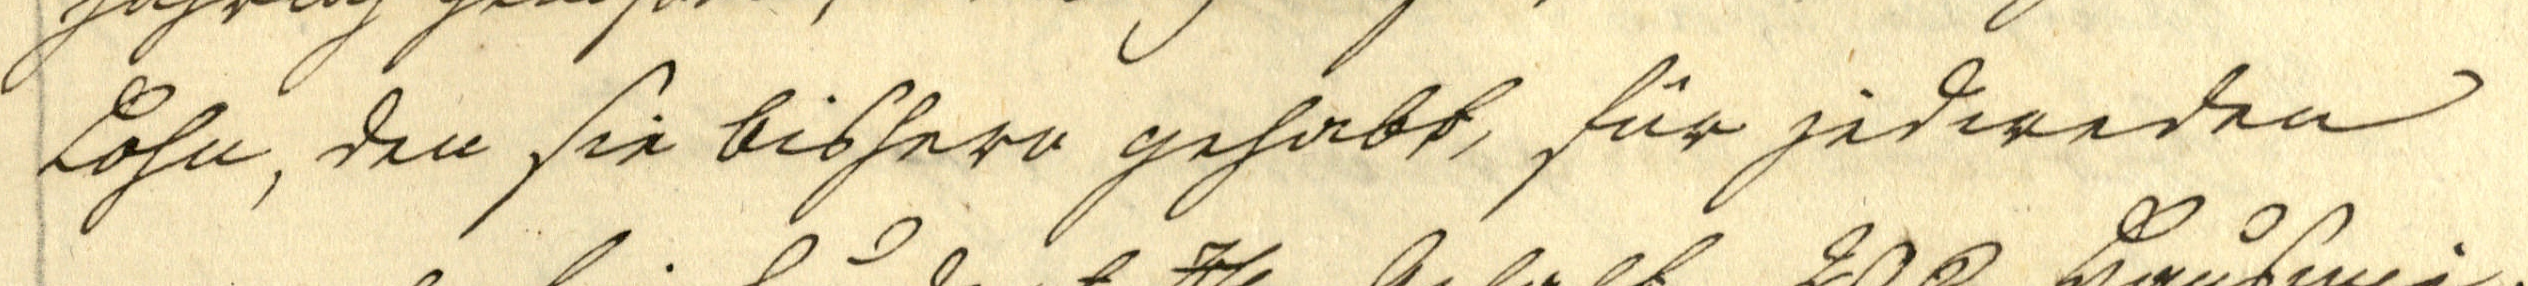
Lohn, den sie bishero gehabt, für jedweden
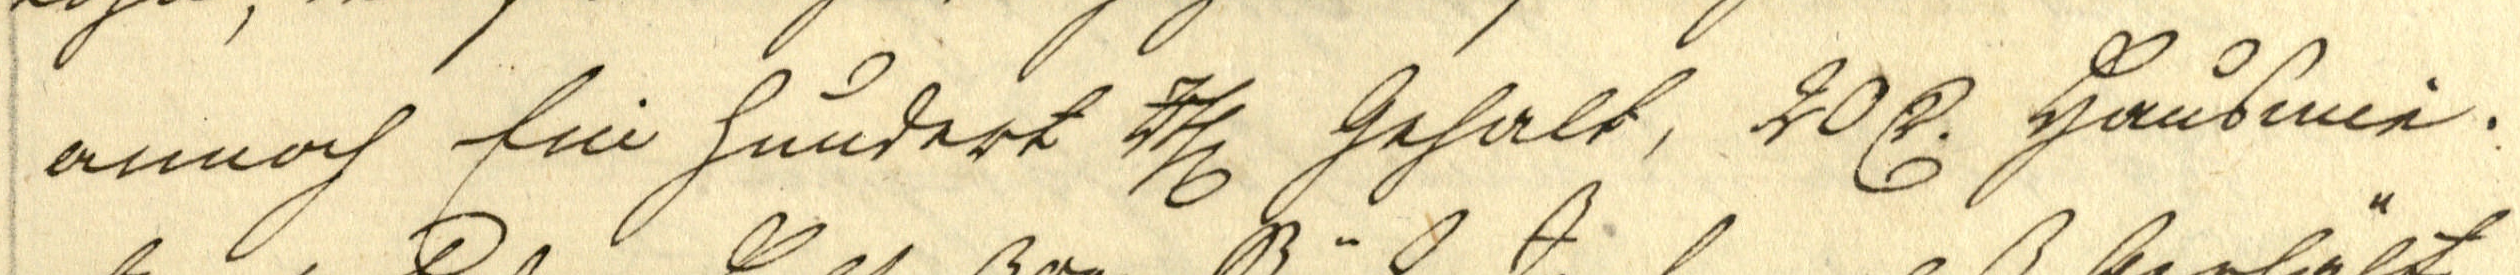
annoch Ein hundert rth. Gehalt, 20 l. Hausmie¬
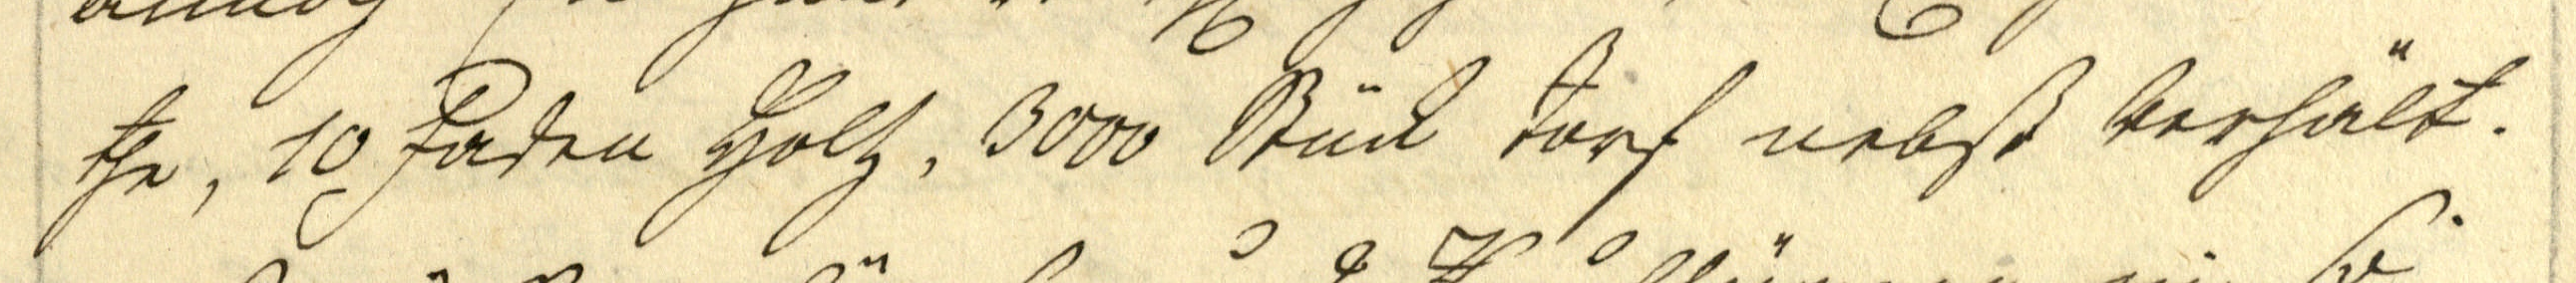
the, 10 Faden Holz, 3000 Stück Torf nebst verhält¬
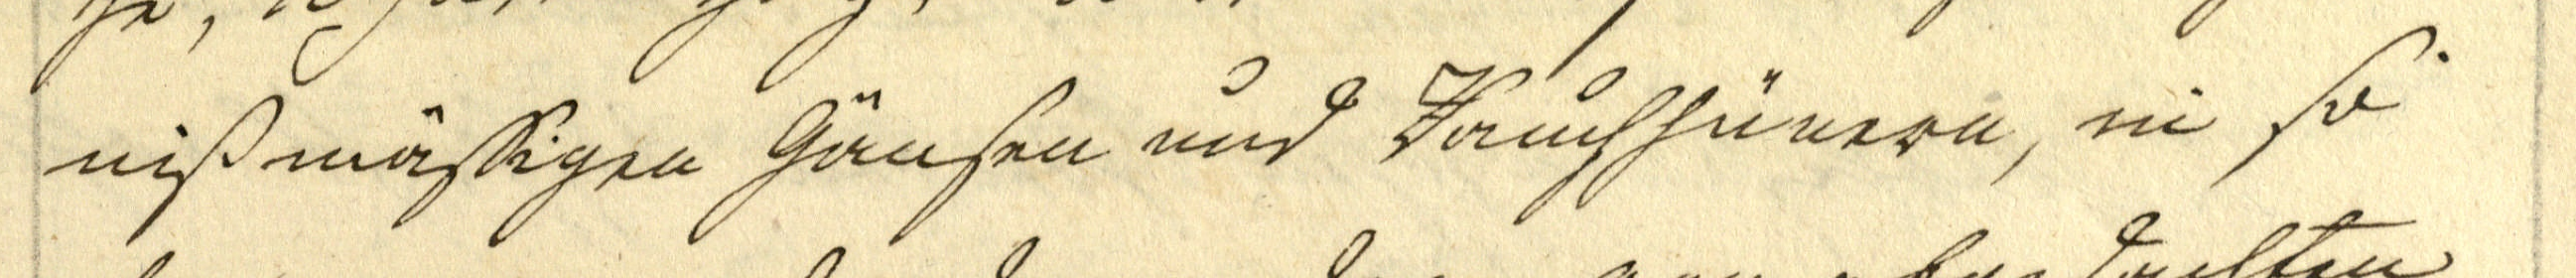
nißmässigen Gänsen und Rauchhünern, in so
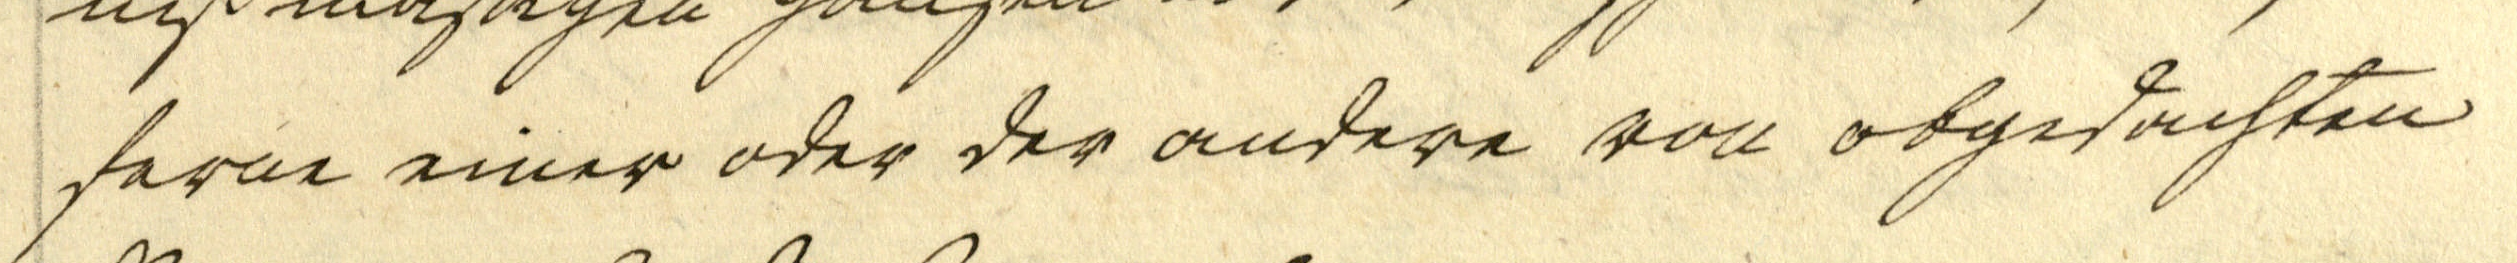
ferne einer oder der andere von obgedachten
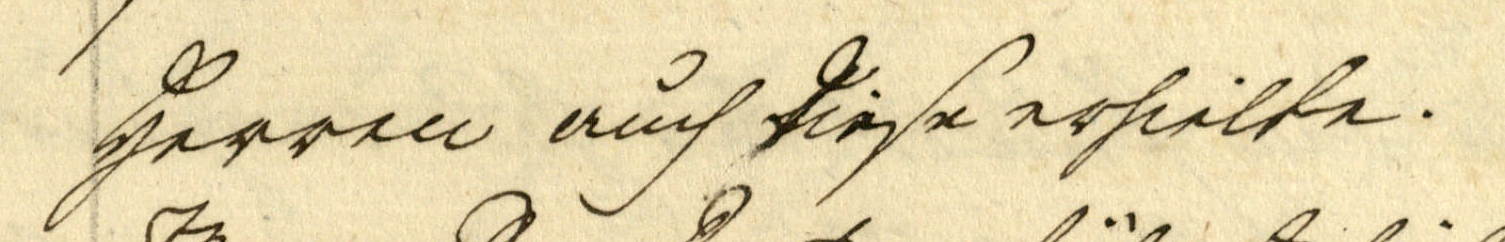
Herren auch diese erhielte.
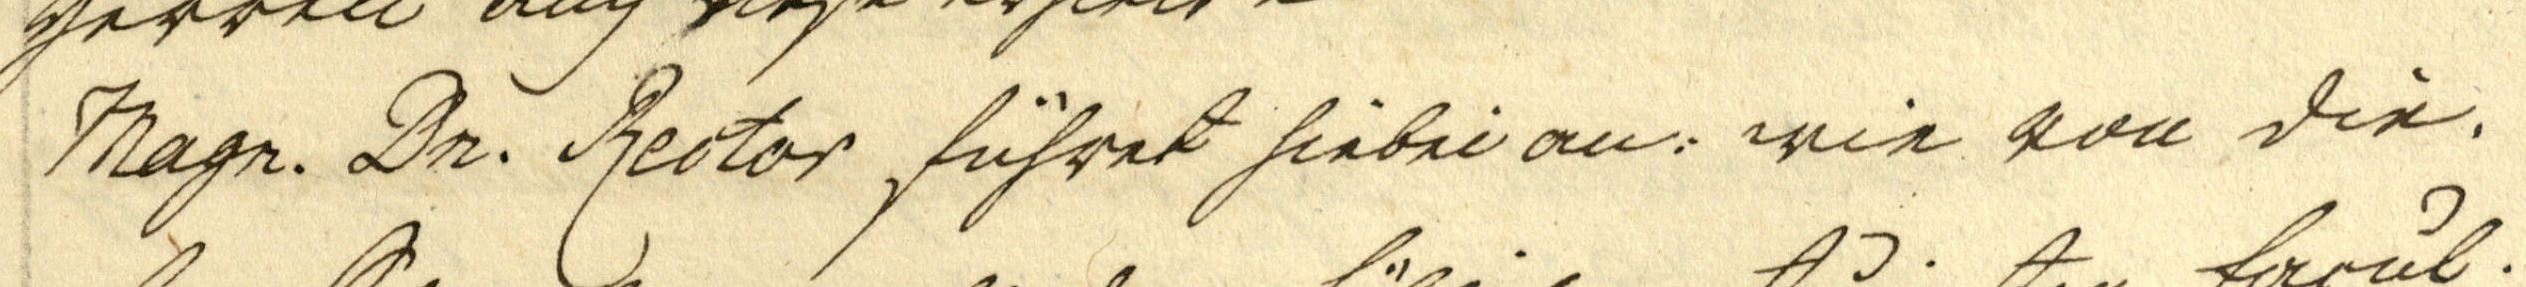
Magn. Dn. Rector führet hiebei an: wie von die¬
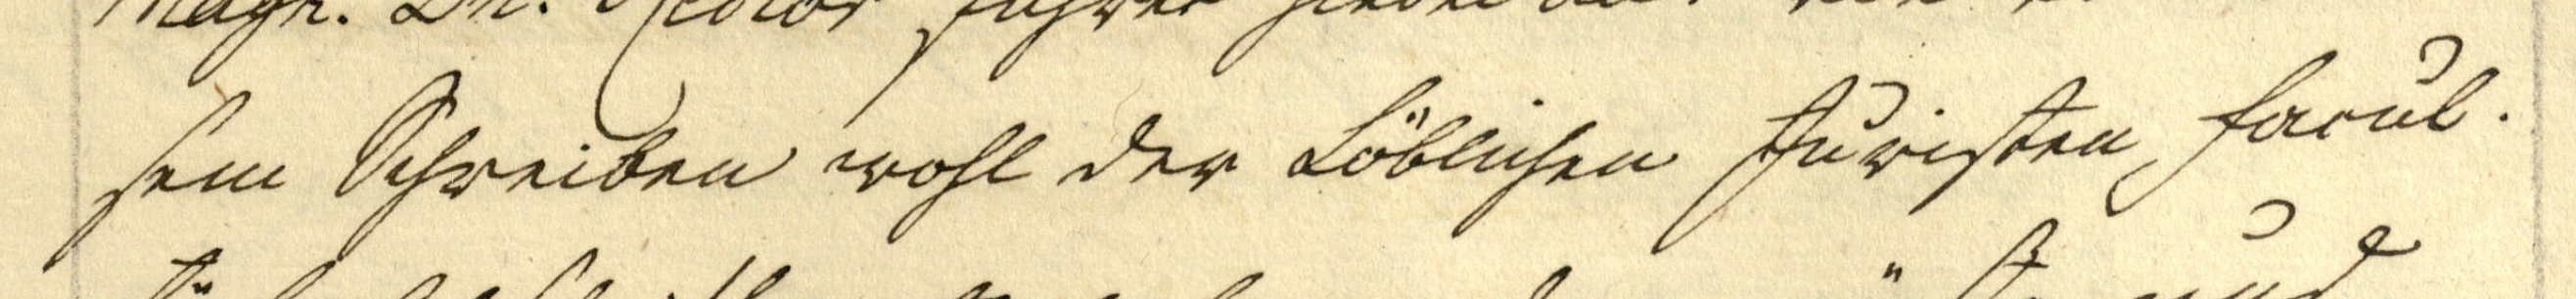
sen Schreiben wohl der Löblichen Juristen, Facul¬
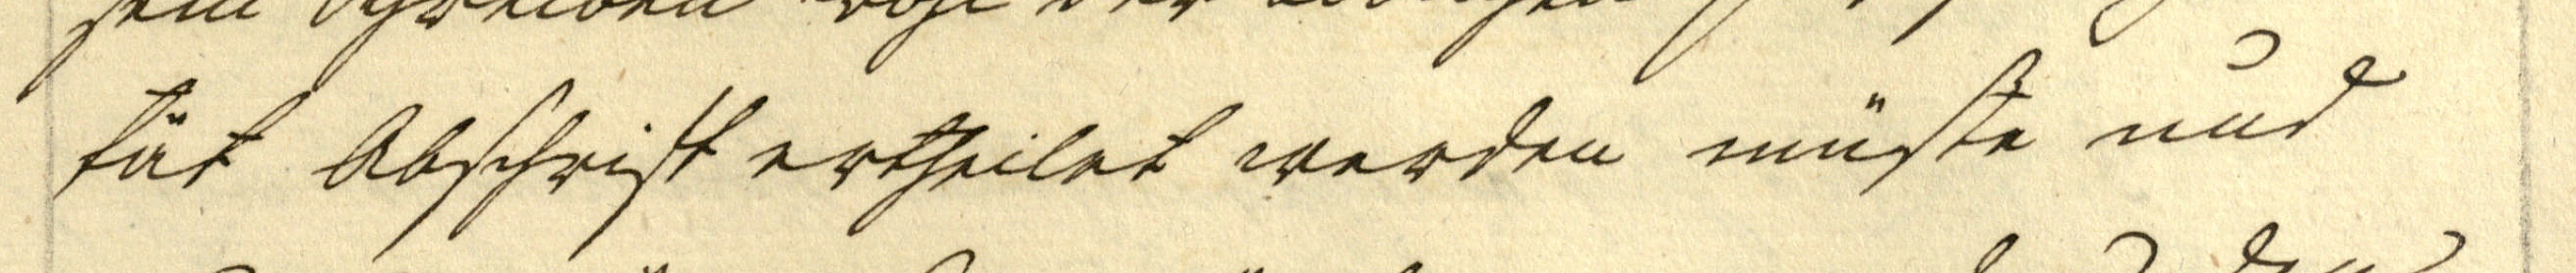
tät Abschrift ertheilet werden müßte und
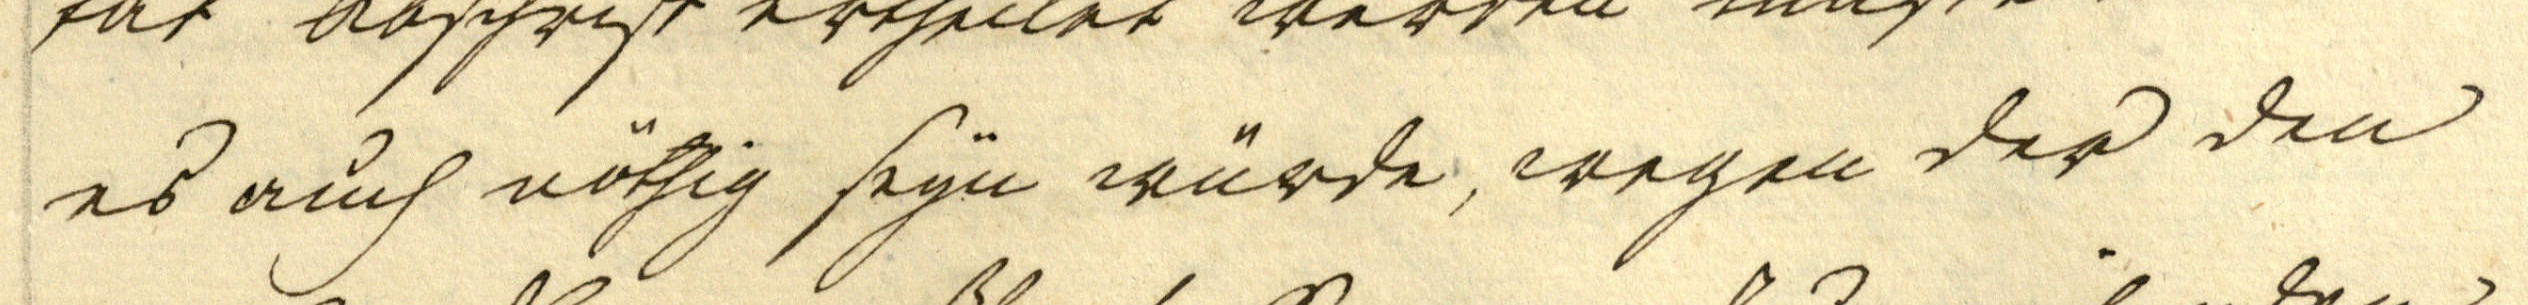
es auch nöthig seÿn würde, wegen der den
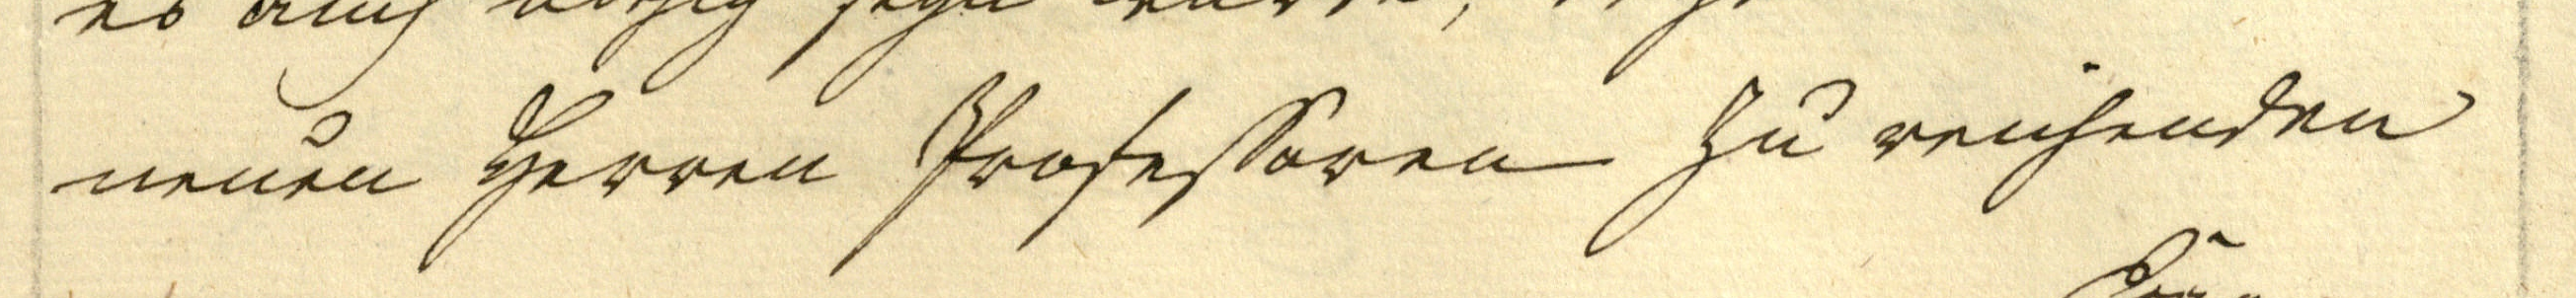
neuen Herren Professoren zu reichenden
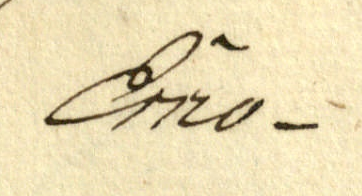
Emo-
